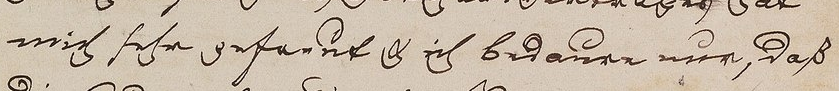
mich sehr gefreut & ich bedaure nur, daß
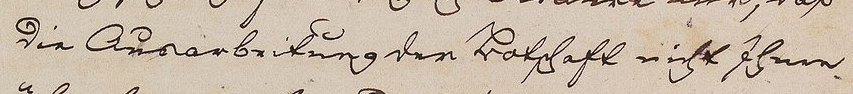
die Ausarbeitung der Botschaft nicht Ihnen
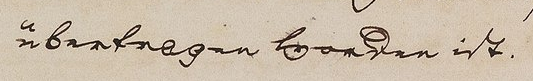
übertragen worden ist.
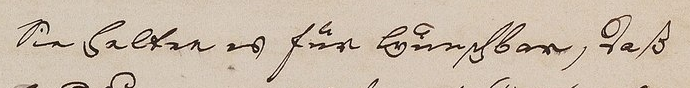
Sie halten es für wünschbar, daß
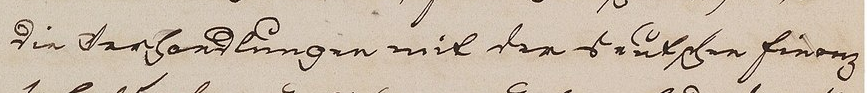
die Verhandlungen mit der deutschen Finanz
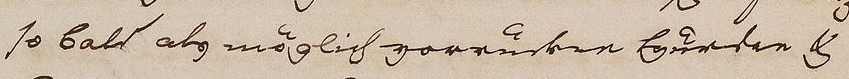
so bald als möglich vorrücken würden &
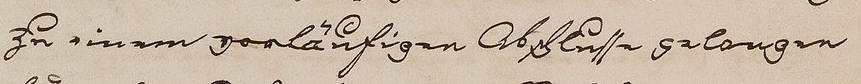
zu einem vorläufigen Abschlusse gelangen
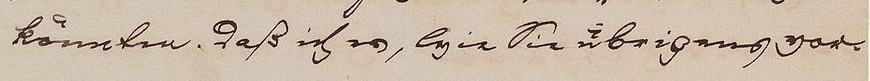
könnten. Daß ich es, wie Sie übrigens vor-
